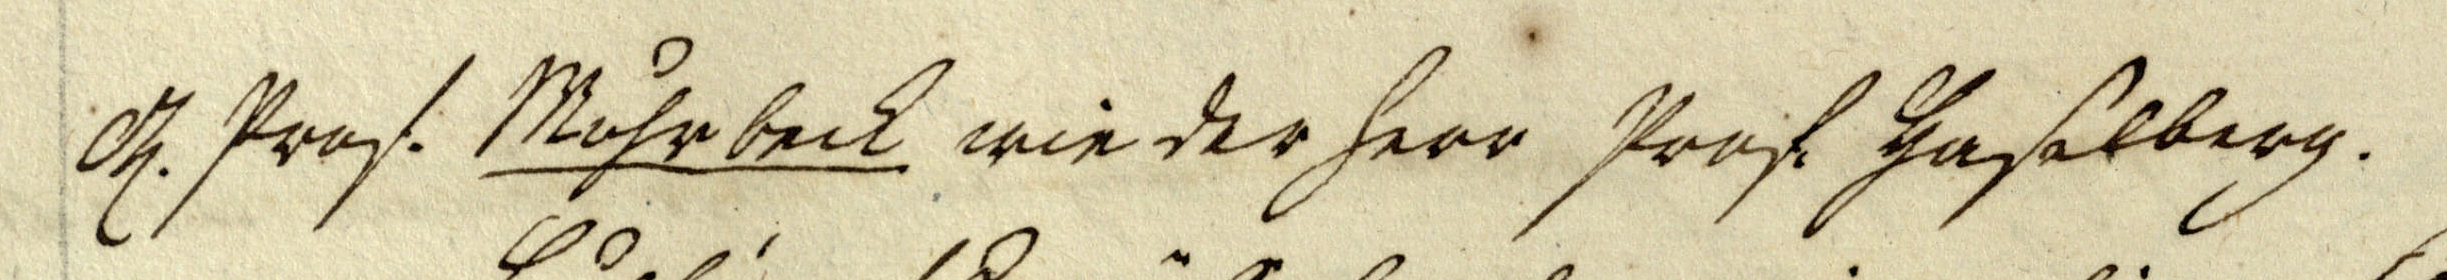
dh. Prof. Muhrbeck. wie der Herr Prof. Haselberg.
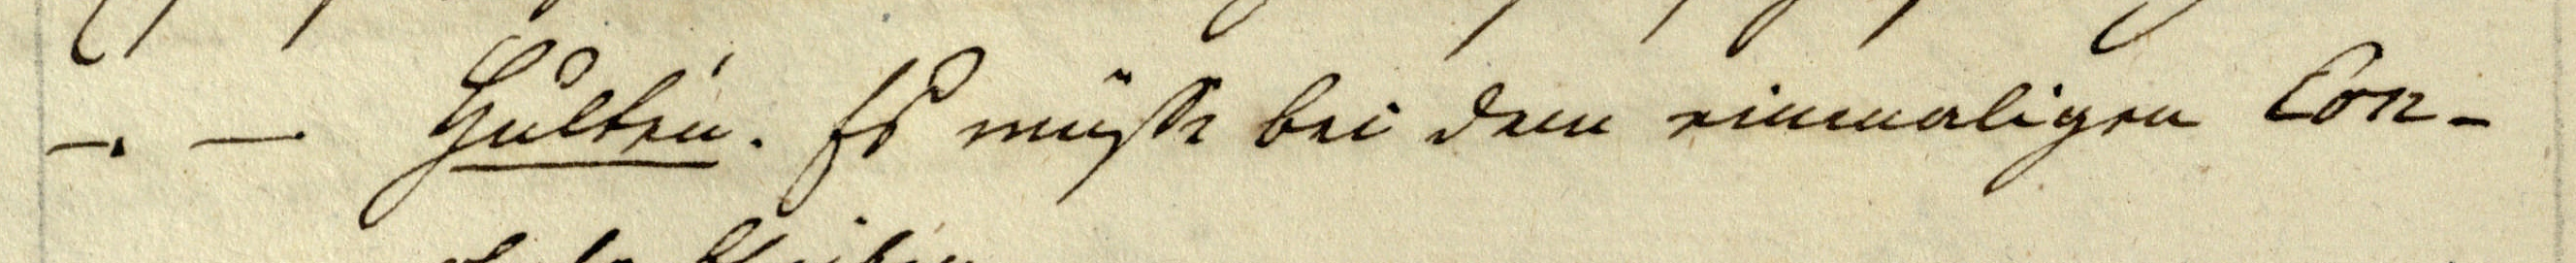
Hultén. Es müsse bei dem einmaligen Con¬
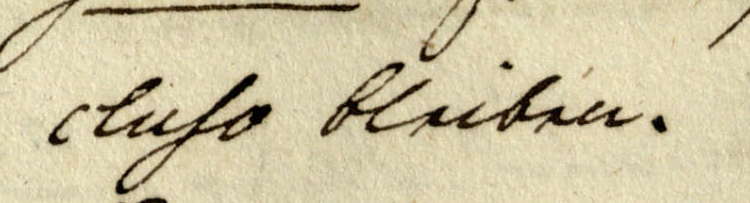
cluso bleiben.
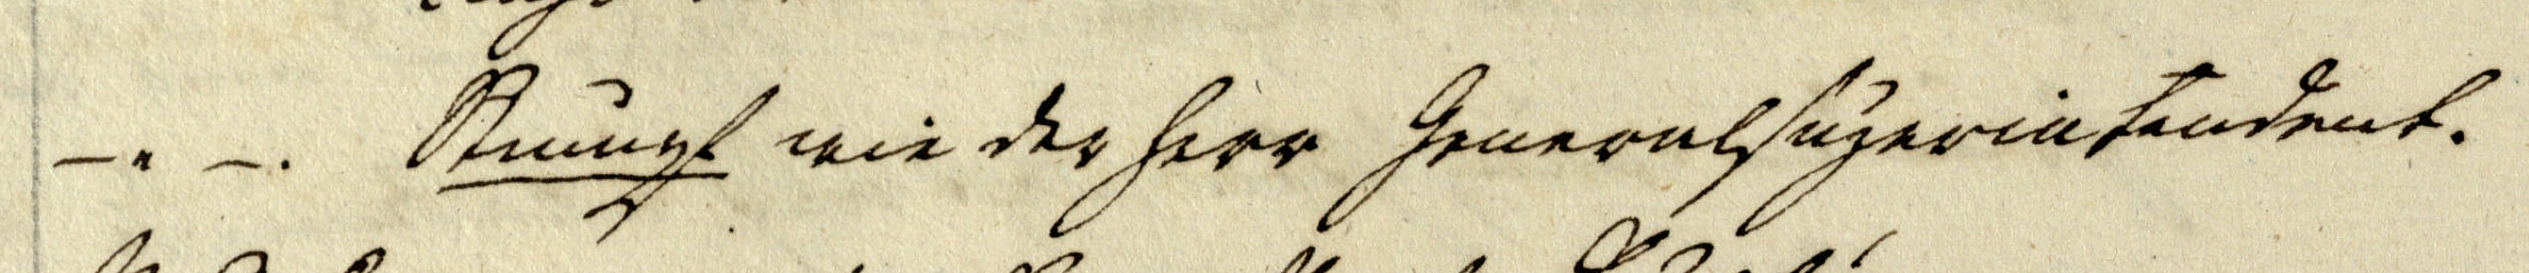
Stumpf wie der Herr Generalsuperintendent.
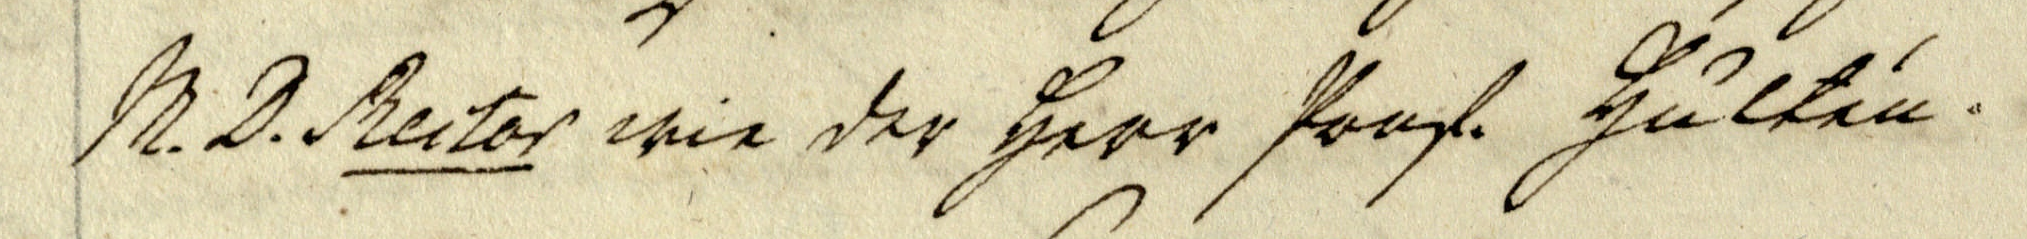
M. D. Rector wie der Herr Prof. Hultén.
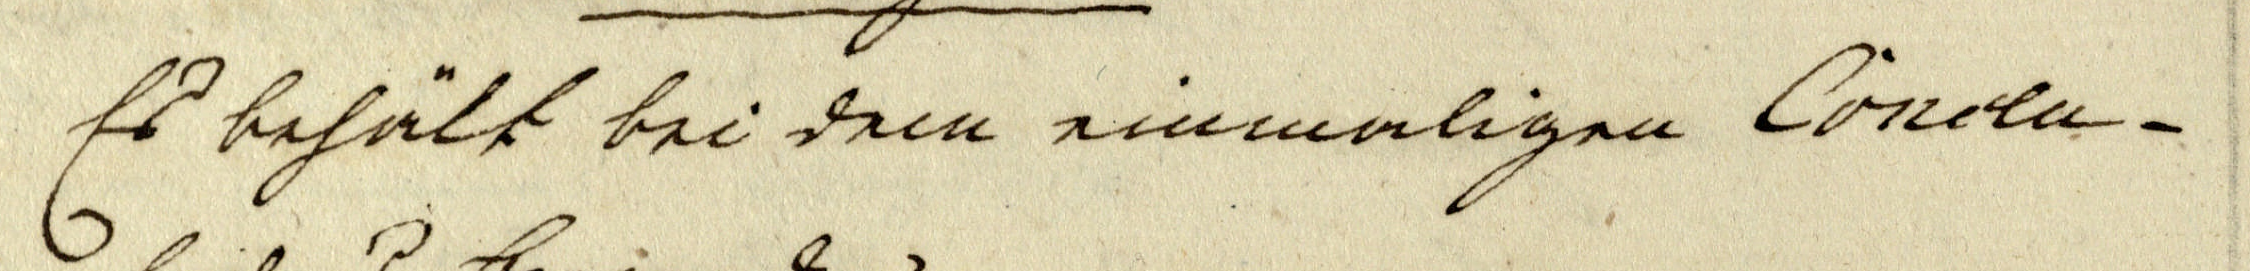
Es behält bei dem einmaligen Conclu¬
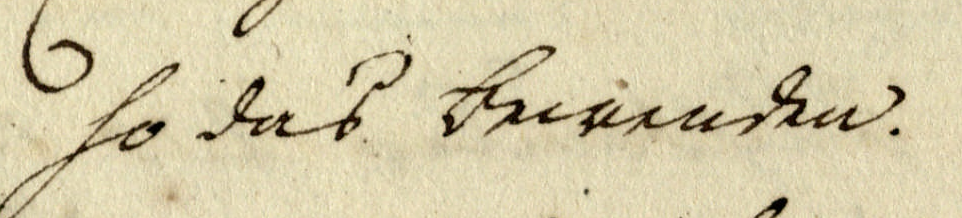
so das Bewenden.
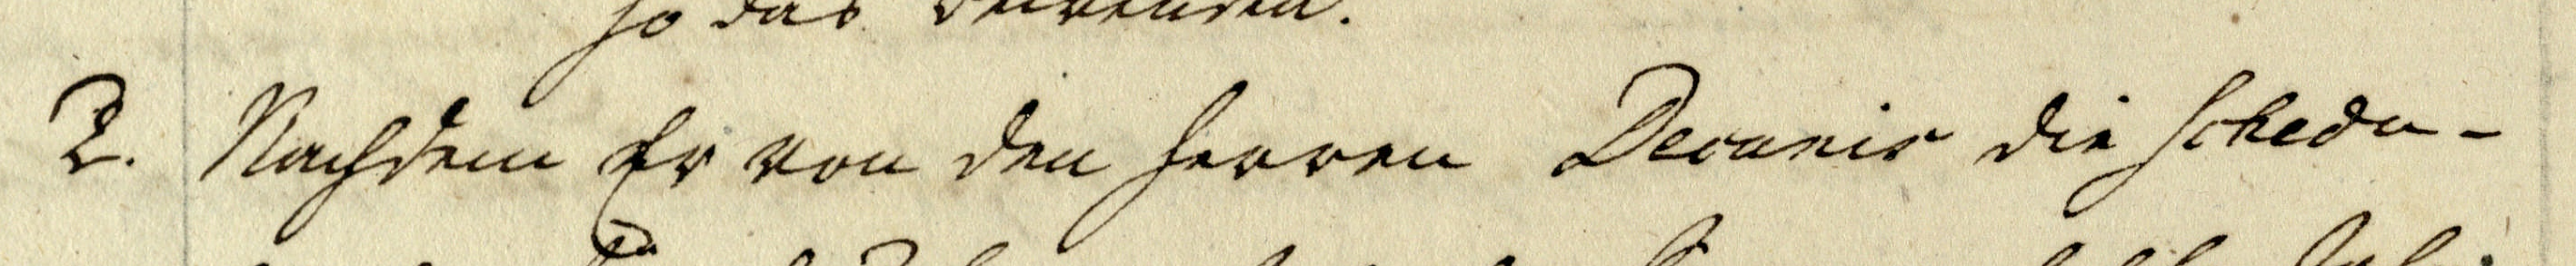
2. Nachdem Er von den Herren Decanis die schedu¬
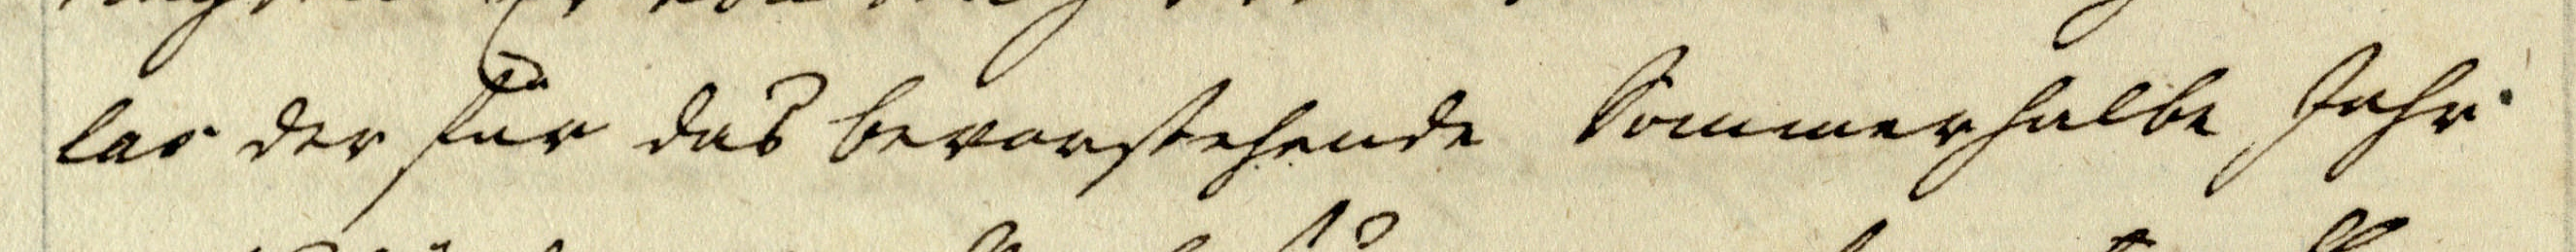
las der für das bevorstehende Sommerhalbe Jahr
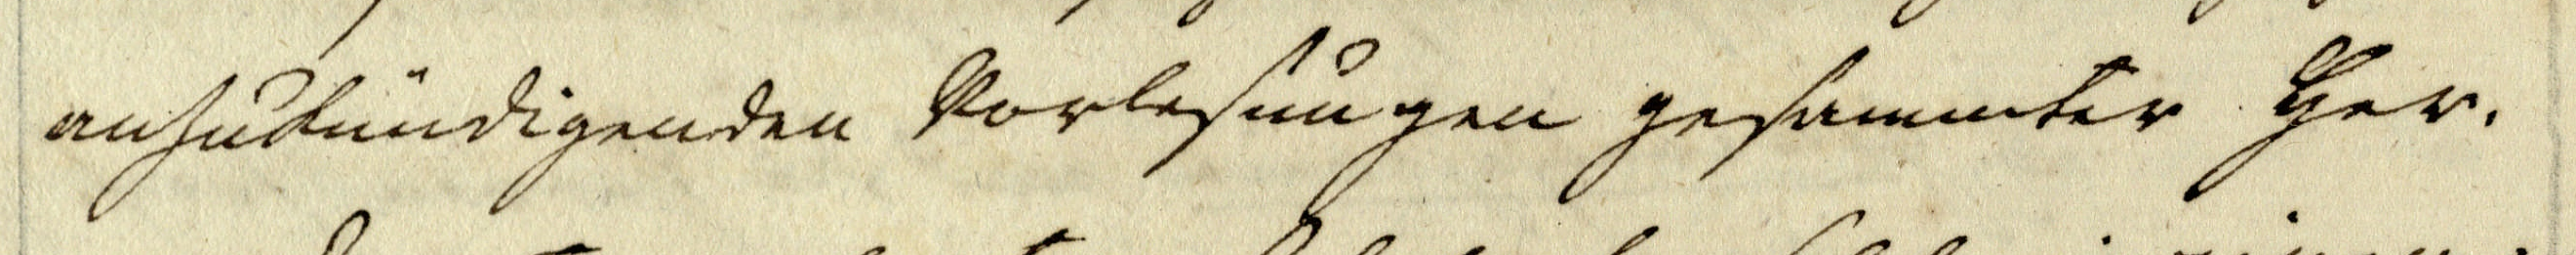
anzukündigenden Vorlesungen gesammter Her¬
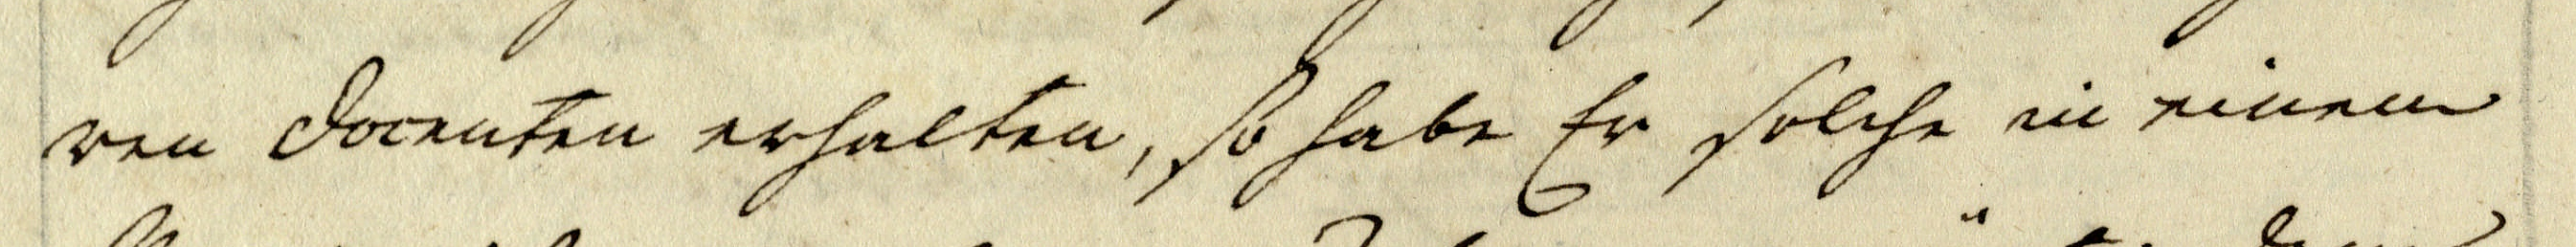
ren Docenten erhalten, so habe Er solche in einem
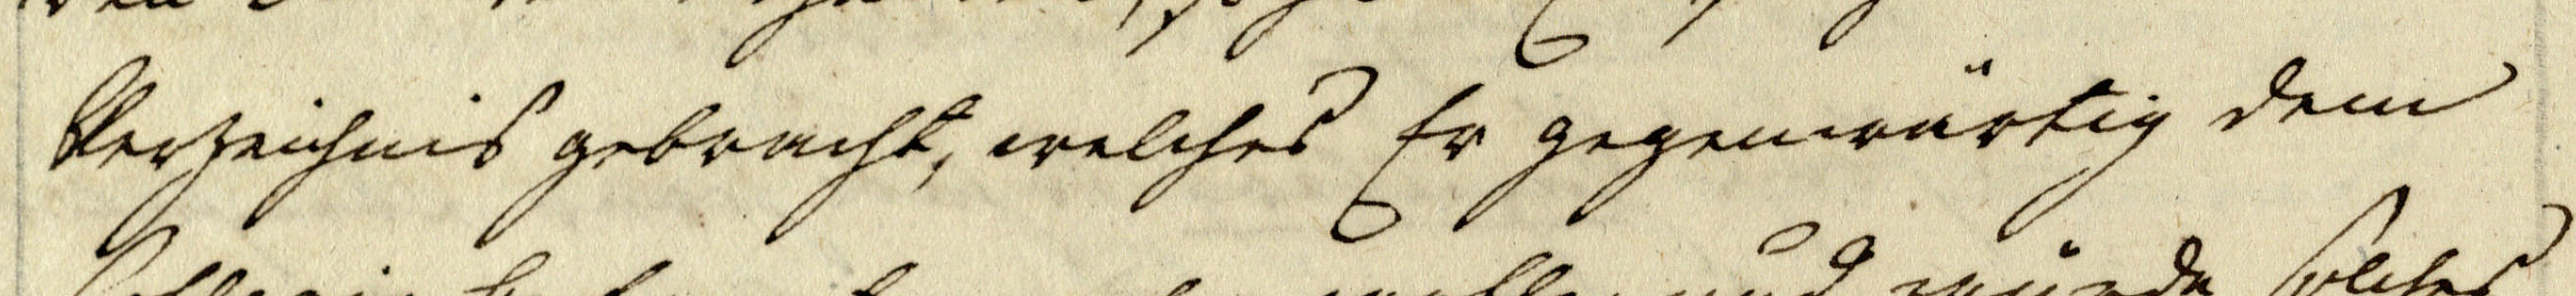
Verzeichnis gebracht, welches Er gegenwärtig dem
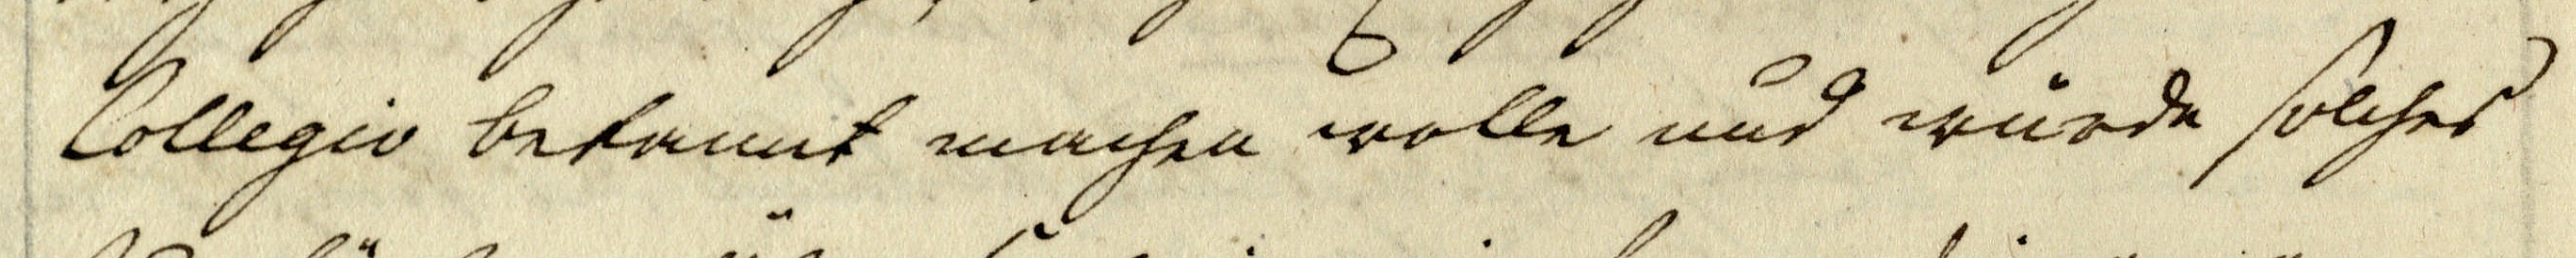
Collegio bekannt machen wolle und würde solches
